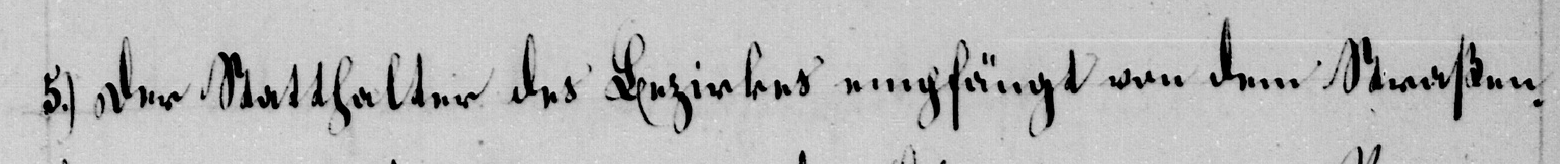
5.) Der Statthalter des Bezirkes empfängt von dem Straßen¬
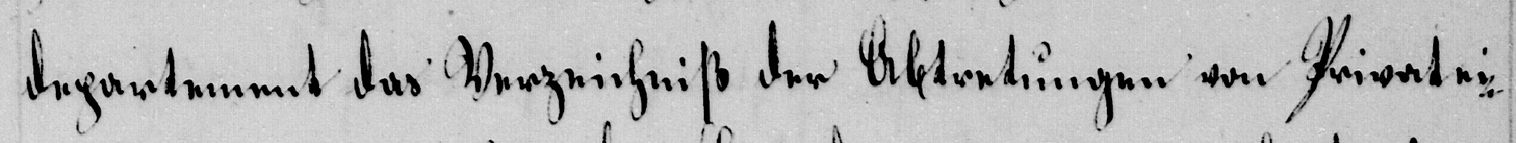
departement das Verzeichniß der Abtretungen von Privatei¬
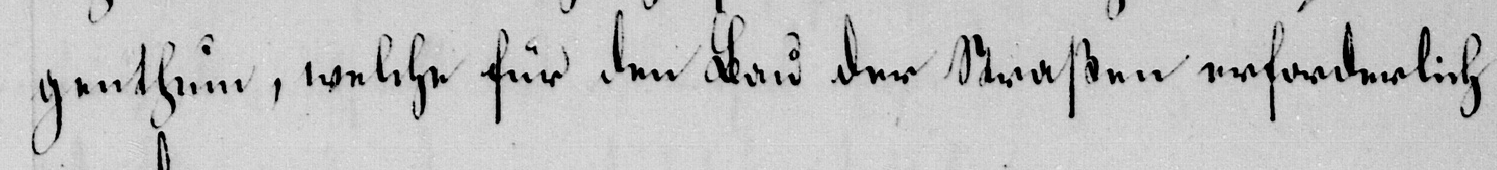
genthum, welche für den Bau der Straßen erforderlich
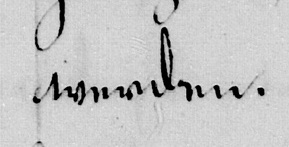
werden.
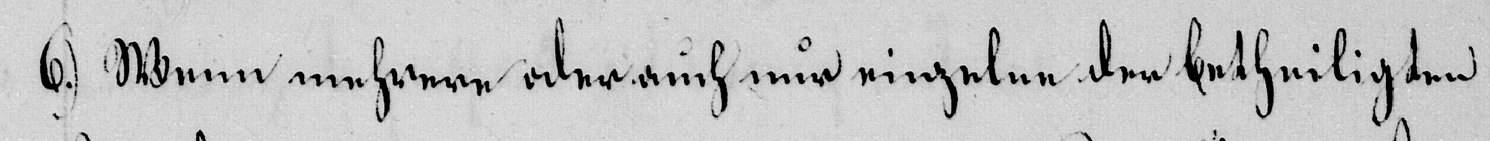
6.) Wenn mehrere oder auch nur einzelne der betheiligten
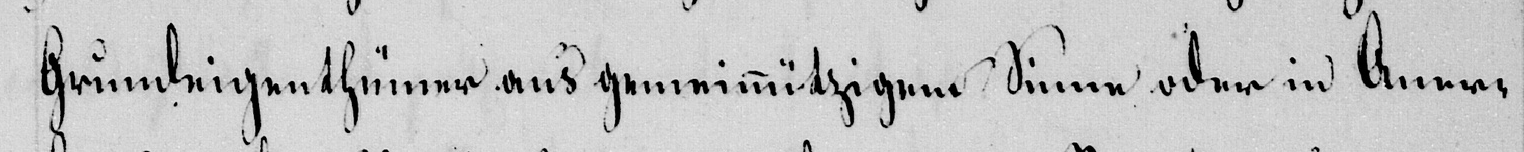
Grundeigenthümer aus gemeinnützigem Sinne oder in Aner¬
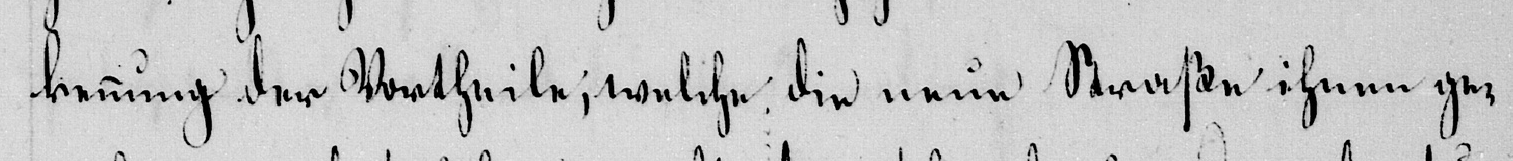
kennung der Vortheile, welche die neue Straße ihnen ge¬
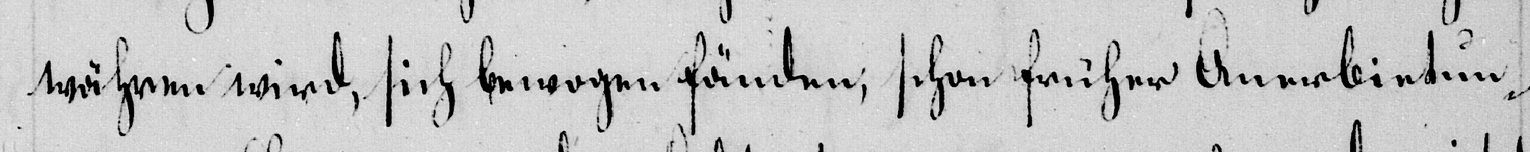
währen wird, sich bewogen fänden, schon früher Anerbietun¬
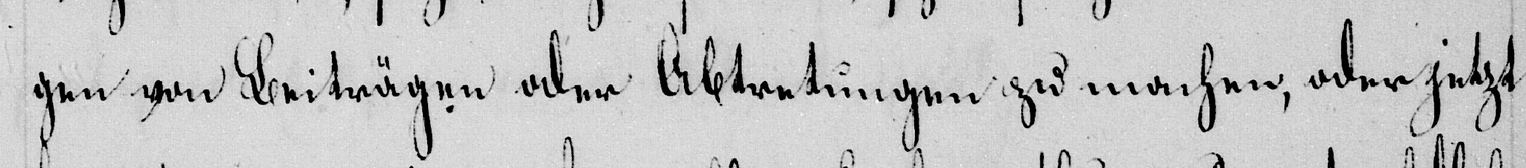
gen von Beiträgen oder Abtretungen zu machen, oder jetzt
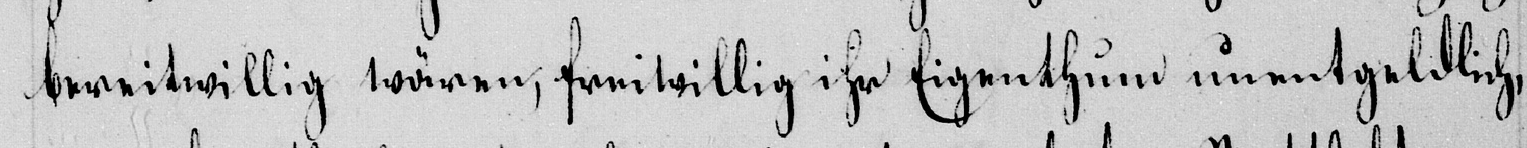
bereitwillig wären, freiwillig ihr Eigenthum unentgeldlich,
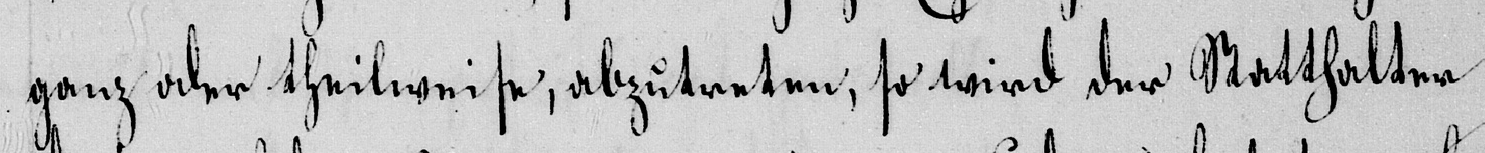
ganz oder theilweise, abzutreten, so wird der Statthalter
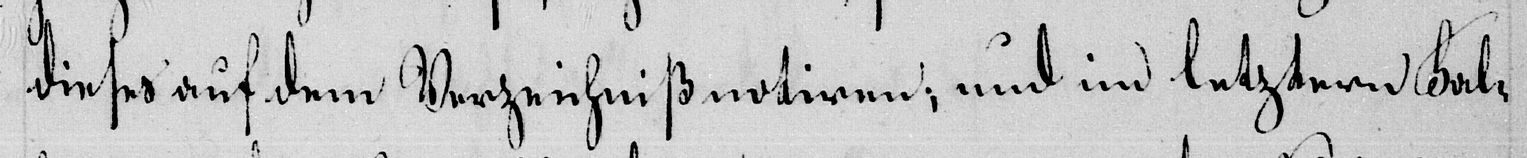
dieses auf dem Verzeichniß notiren; und im letztern Fal¬
